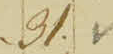31.
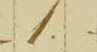1.
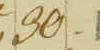30
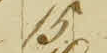15.
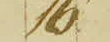16
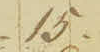15
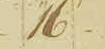16
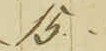15.
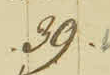39
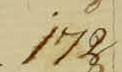172
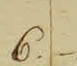6.
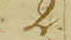2.
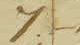7.
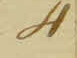4
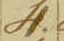4.
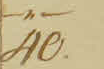40.
